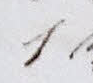1
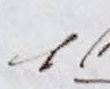1
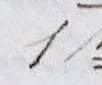1
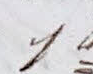1
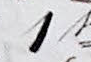1
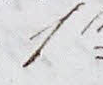1
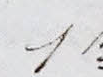1
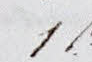1
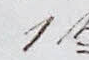1
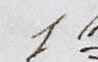1
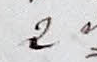2
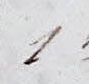1
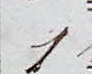1
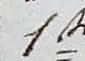1
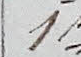1
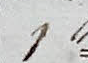1
